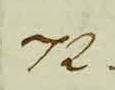72
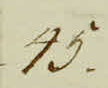45
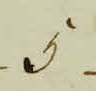5
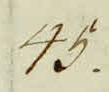45
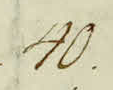40
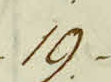19
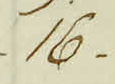16
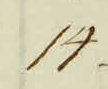14
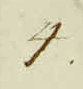4
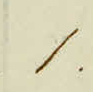1
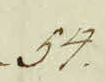54
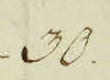30
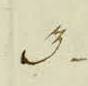3
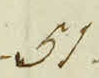51
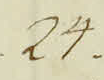24
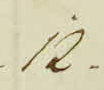12
